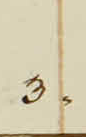3
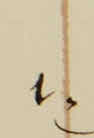1
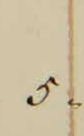5
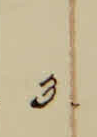3
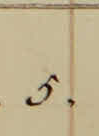5
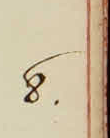8.
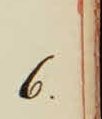6.
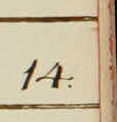14.
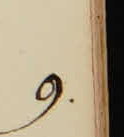9.
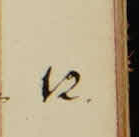12.
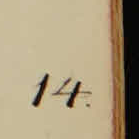14.
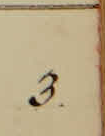3.
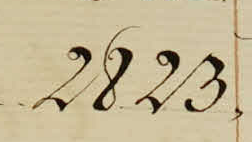2823
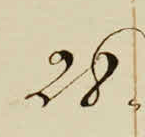28
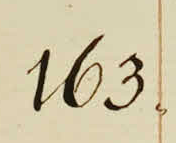163
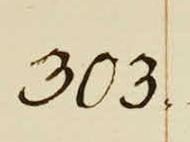303
